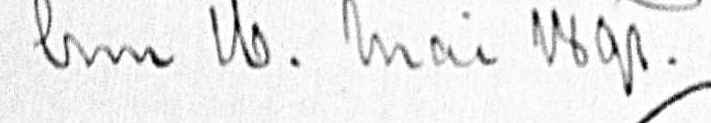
Am 16. Mai 1891
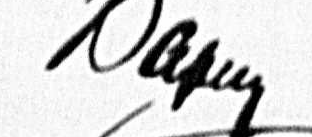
Basny
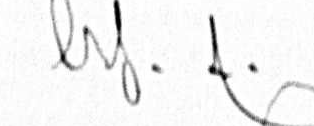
Ah E
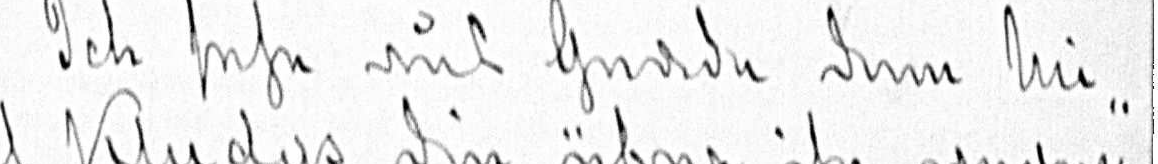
Ich sehe aus Gnade dem Mi¬
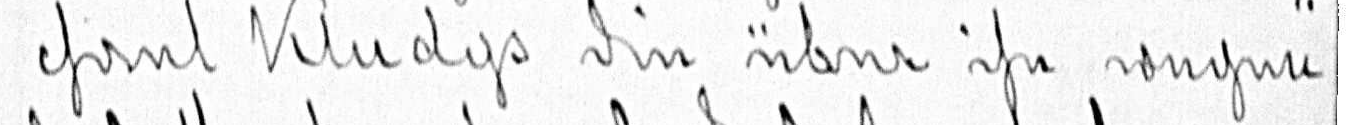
chael Kludys die über ihn wegen
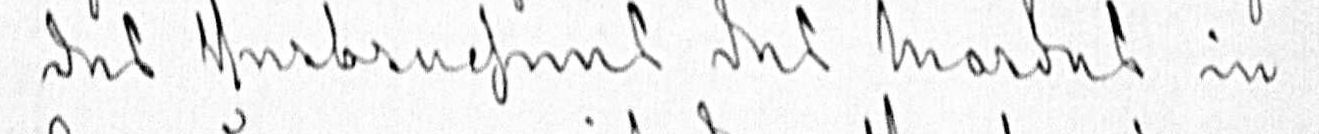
des Verbrechens des Mordes in
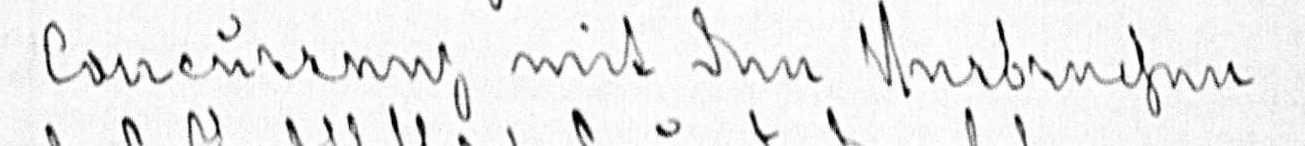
Concurrenz mit dem Verbrechen
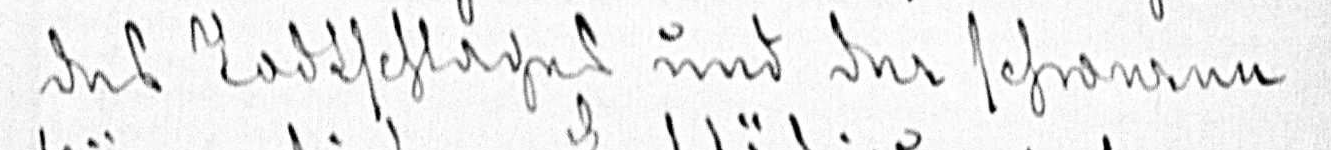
des schweren
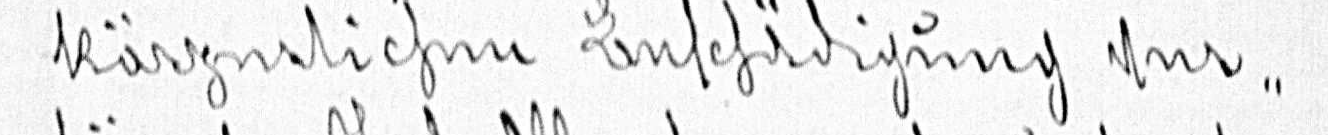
körperlichen Beschädigung ver¬
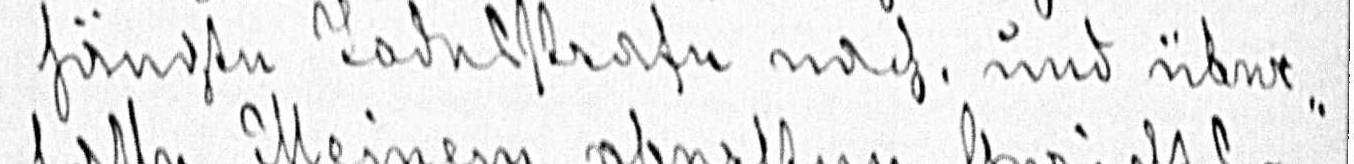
hängte Todesstrafe nach, und über¬
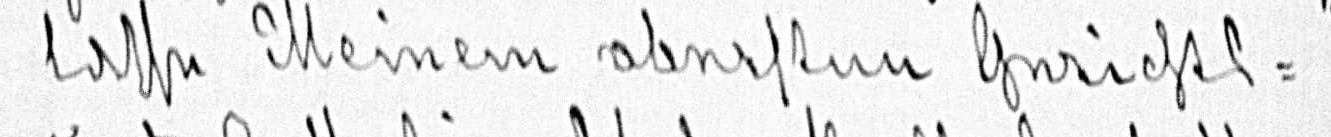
lasse Meinem obersten Gerichts-
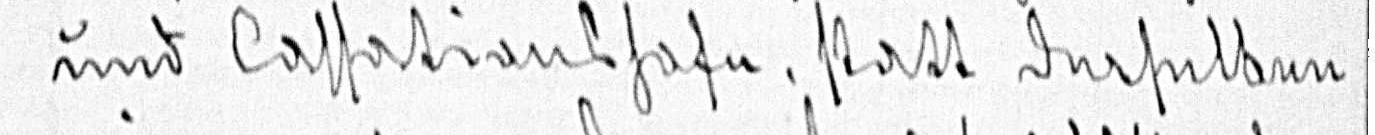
und Cassationshofe, statt derselben
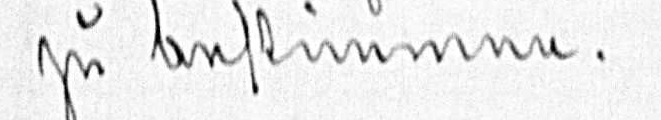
zu bestimmen.
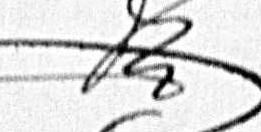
FJ
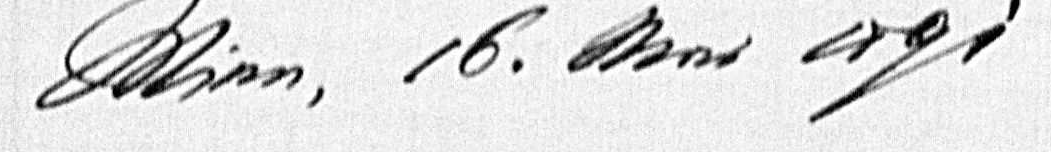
Wien, 16. Mai 1891
